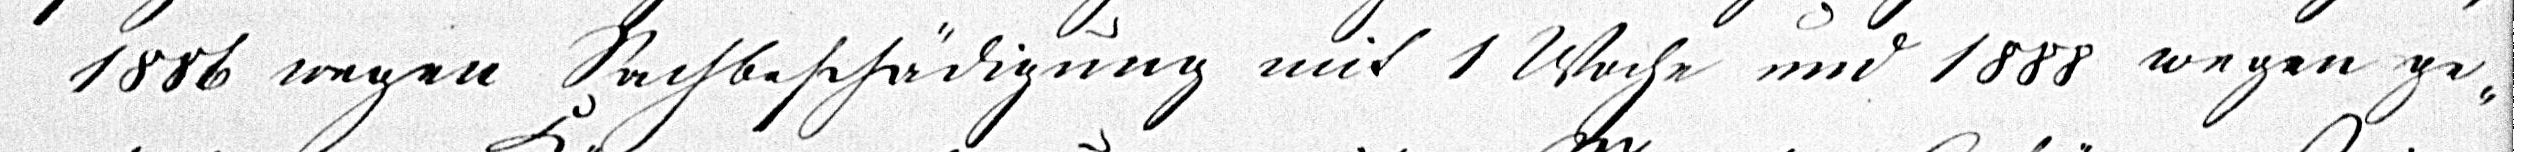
1886 wegen Sachbeschädigung mit 1 Woche und 1888 wegen ge¬
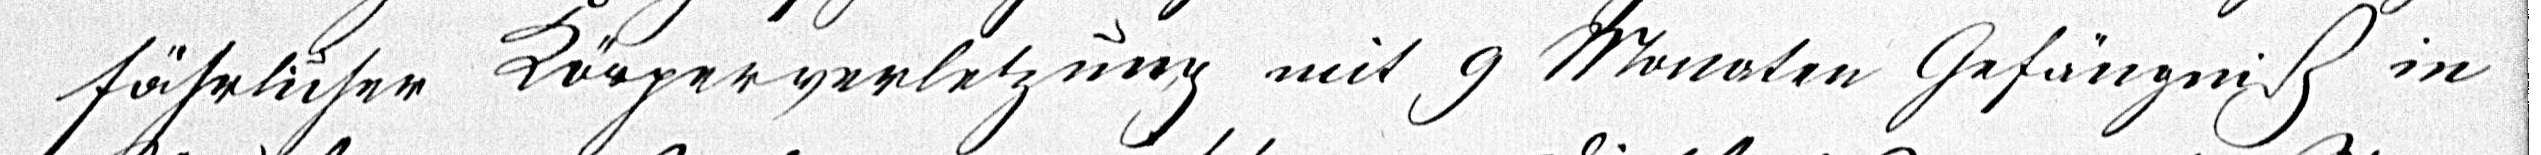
fährlicher Körperverletzung mit 9 Monaten Gefängniß in
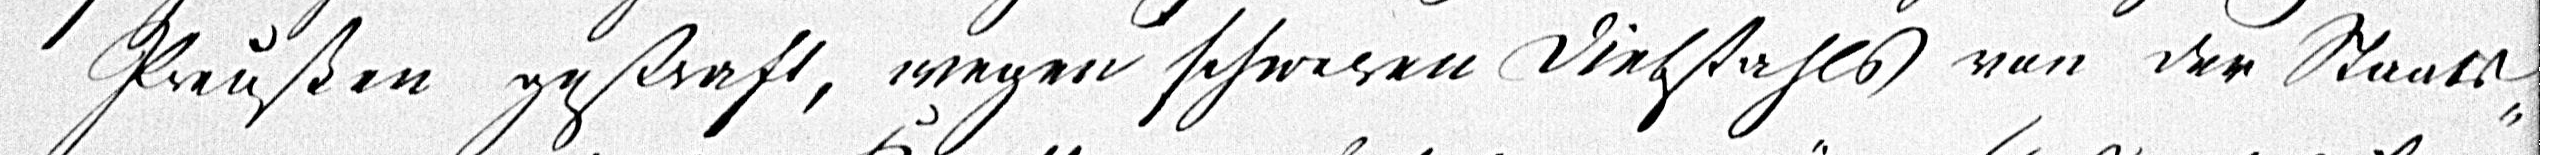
Preußen gestraft, wegen schweren Diebstahls von der Staats¬
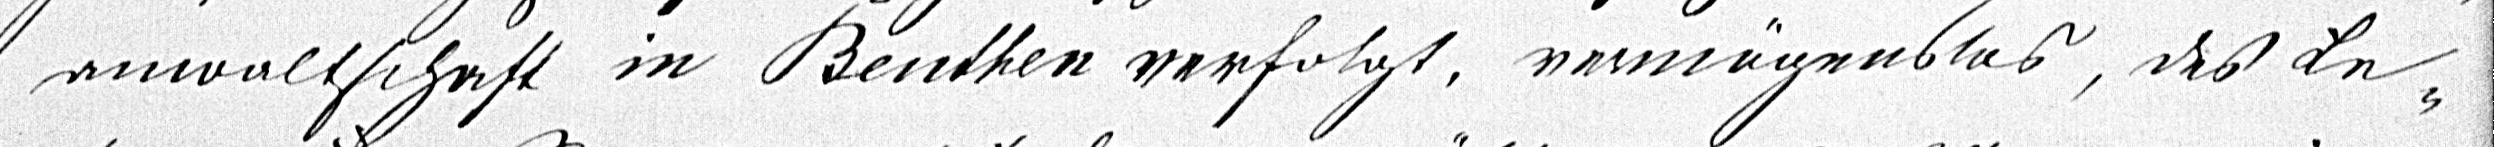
anwaltschaft in Benthen verfolgt, vermögenstes, des Le¬
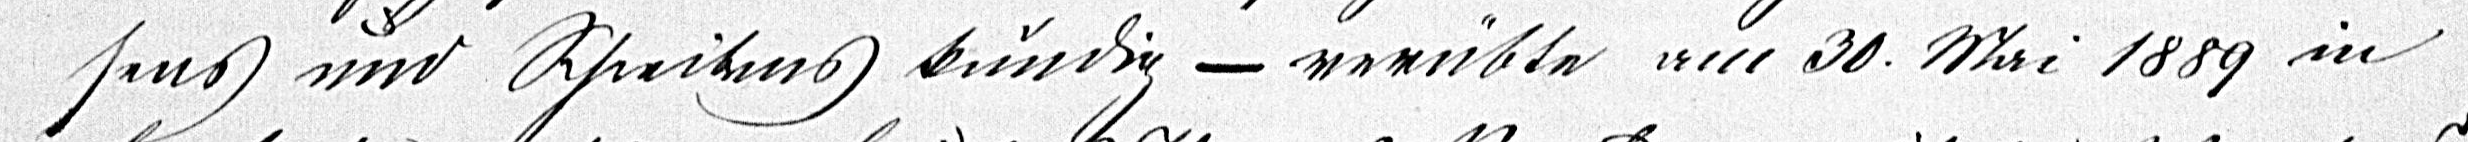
sens und Schreibens kundig – verübte am 30. Mai 1889 in
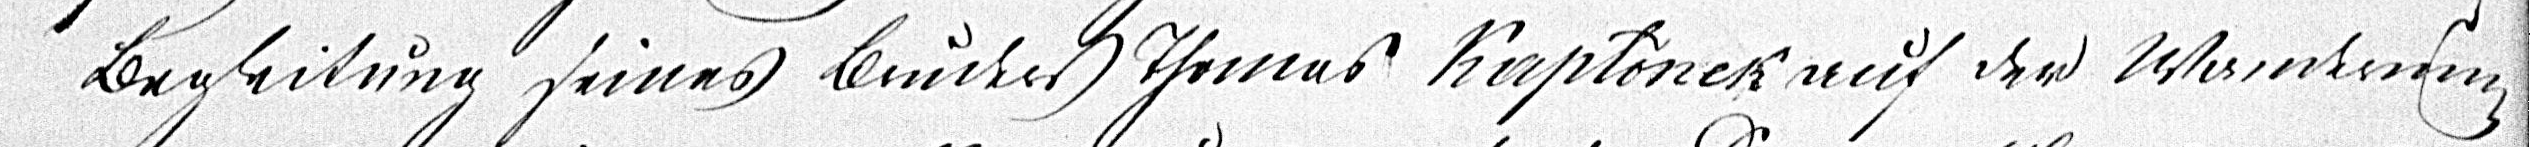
Begleitung seines Bruders Thomas Kaptonek auf der Wanderung
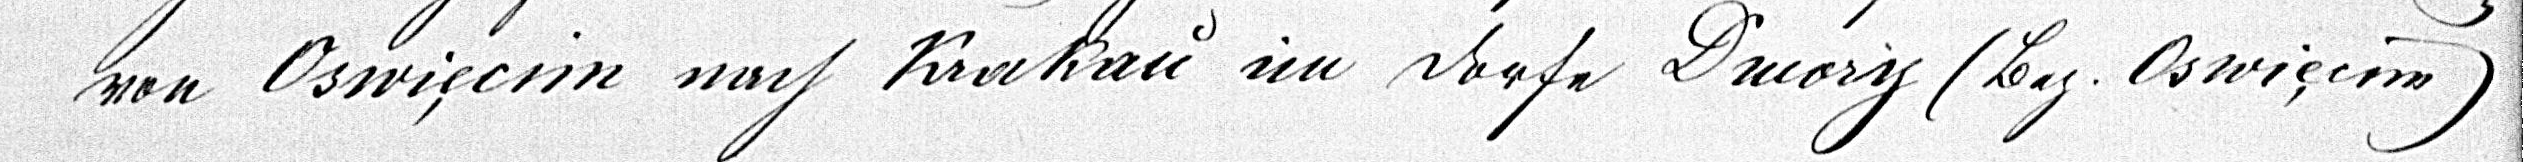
von Oswixxcim nach Krakau im Dorfe Dmoxx (Bez. Oswixxcim)
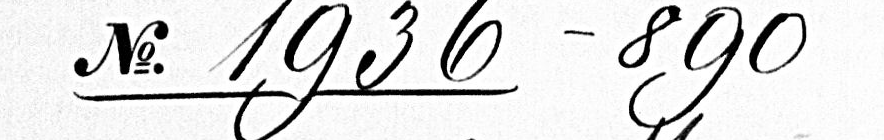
N° 1936 - 890
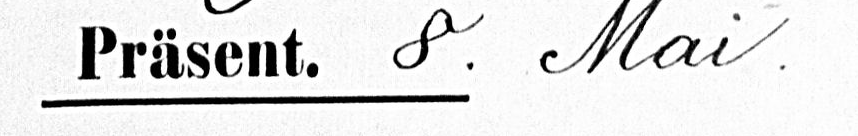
Präsent. 8. Mai
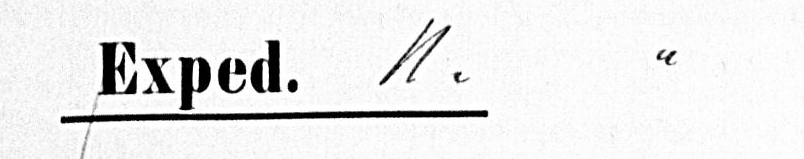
Exped. 11 Mai
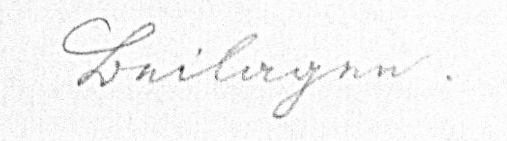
Beilagen.
